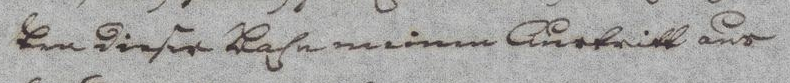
sten dieser Bahn meinen Austritt aus
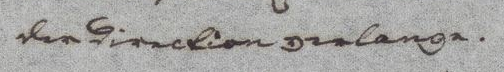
der Direction verlange.
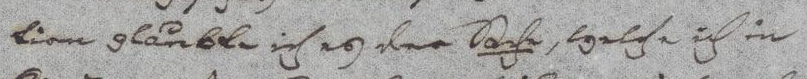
tion glaubte ich es der Sache, welche ich in
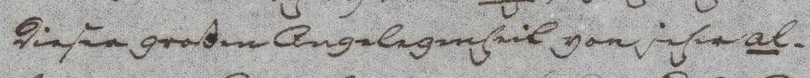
dieser großen Angelegenheit von jeher al-
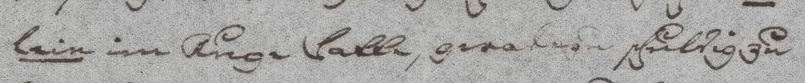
lein im Auge hatte, geradezu schuldig zu
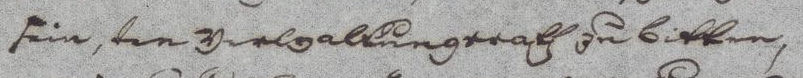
sein, den Verwaltungsrath zu bitten,
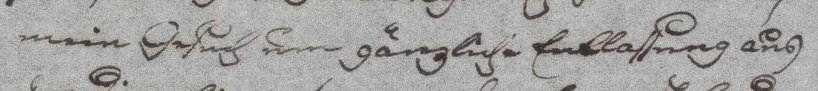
mein Gesuch um gänzliche Entlassung aus
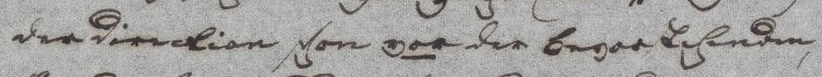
der Direction schon vor der bevorstehenden,
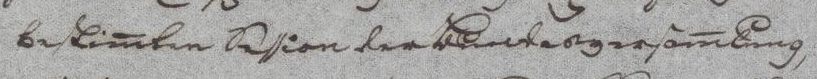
bestimmten Session der Bundesversammlung,
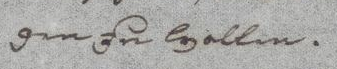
gen zu wollen.
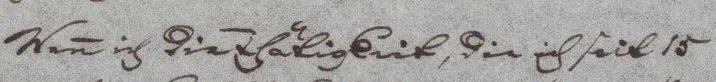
Wenn ich die Thätigkeit, die ich seit 15
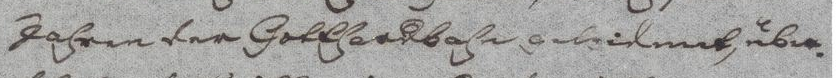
Jahren der Gotthardbahn gewidmet, über-
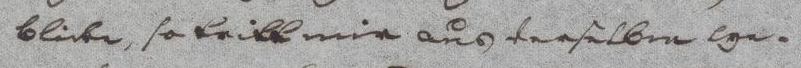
blicke, so tritt mir aus derselben we-
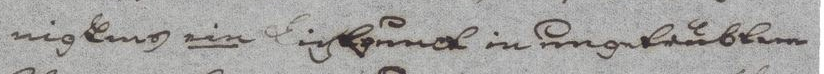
nigstens ein Lichtpunct in ungetrübtem
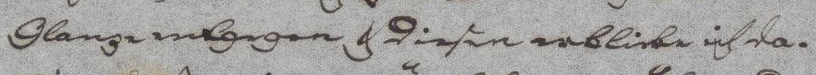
Glanze entgegen & diesen erblicke ich da-
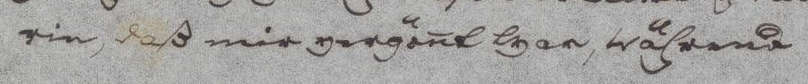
rin, daß mir vergönnt war, während
